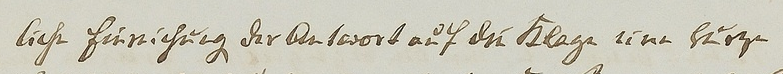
liche Einreichung der Antwort auf die Klage eine kurze
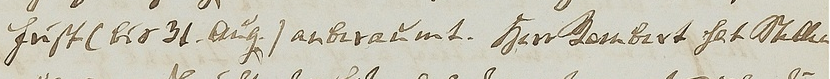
Frist (bis 31. Aug. ) anberaumt. Herr Rambert hat Stellen
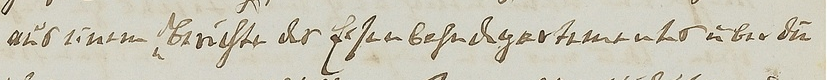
aus einem «Berichte des Eisenbahndepartements über die
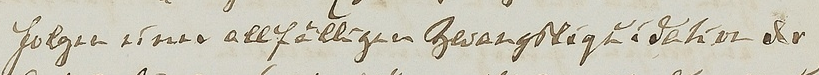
Folgen einer allfälligen Zwangsliquidation der
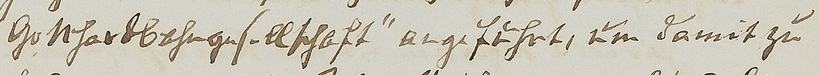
Gotthardbahngesellschaft» angeführt, um damit zu
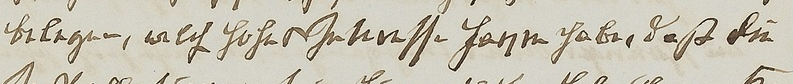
belegen, welch hohes Interesse Favre habe, daß die
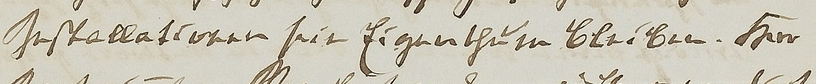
Installationen sein Eigenthum bleiben. Herr
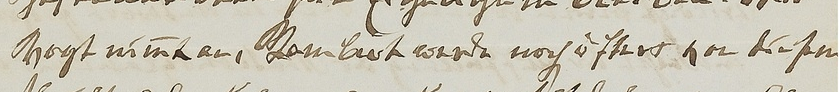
Vogt nimmt an, Rambert werde noch öfters von diesem
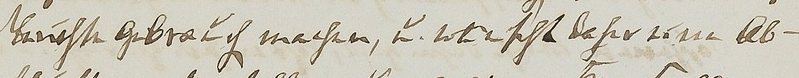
Berichte Gebrauch machen, u. wünscht daher eine Ab-
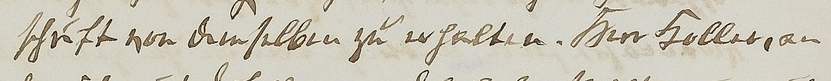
schrift von demselben zu erhalten. Herr Koller, an
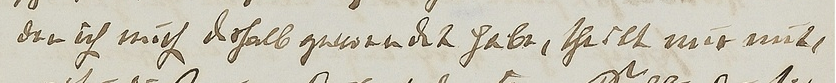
den ich mich deshalb gewendet habe, theilt mir mit,
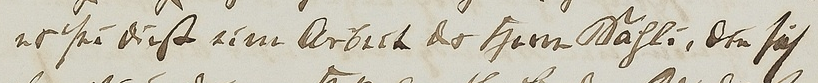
es sei dieß eine Arbeit des Herrn Sahli, die sich
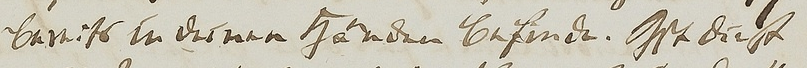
bereits in Deinen Händen befinde. Ist dieß
